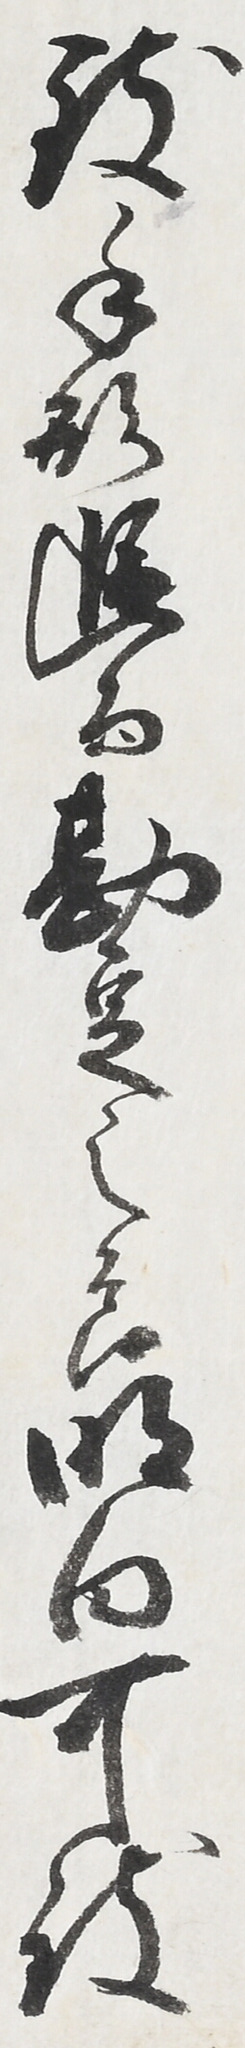致手形追而勘定之節明白可致
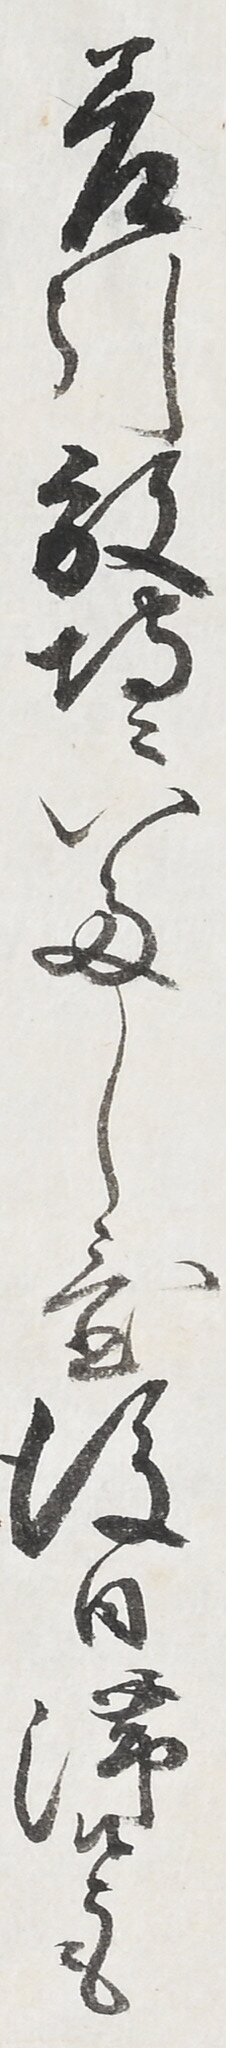差引放埒ニいたし置後日滞候とも
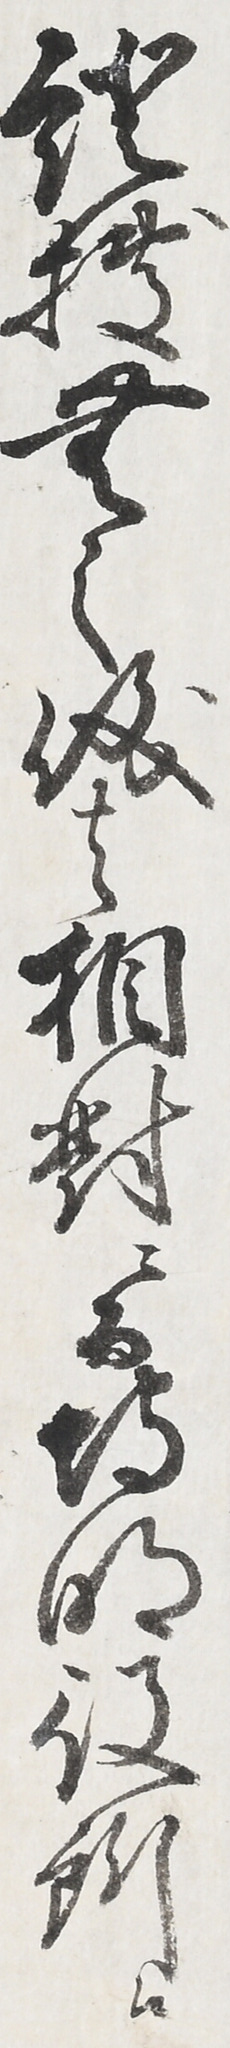証拠無之儀者相対ニ而埒明役所江
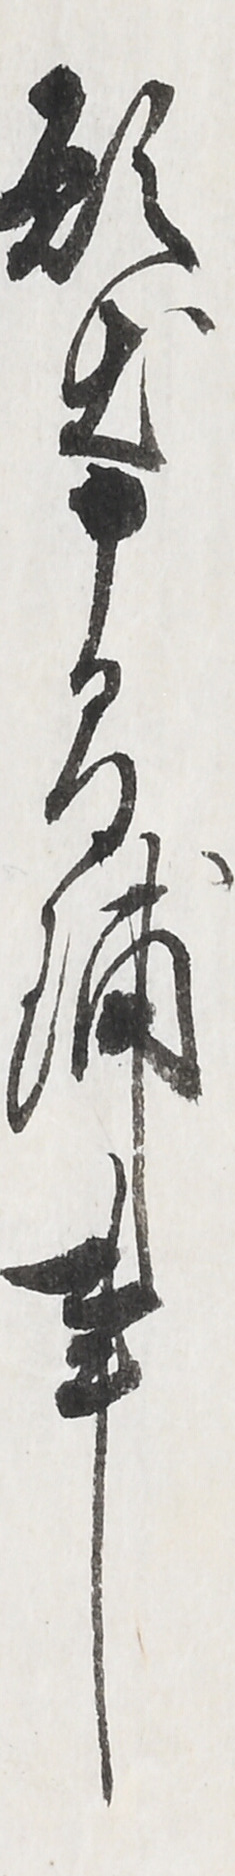願出申間敷事
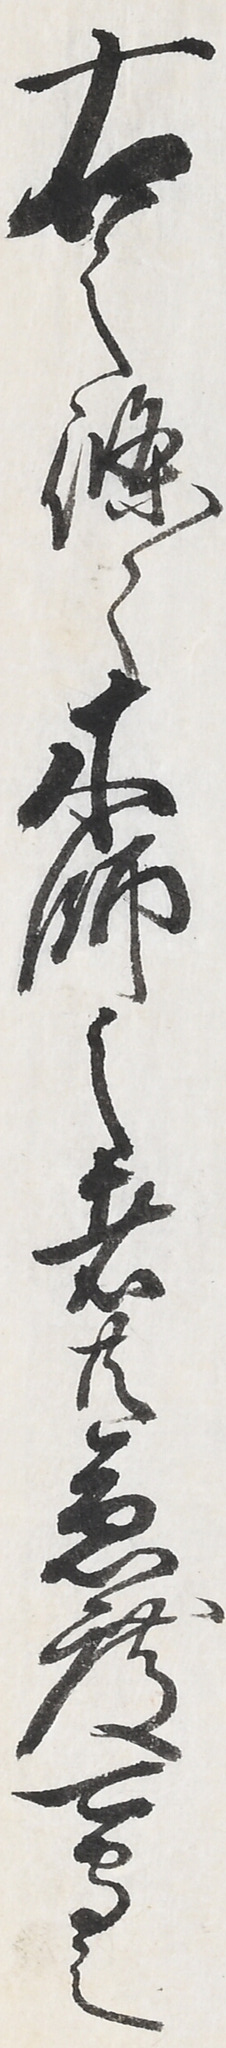右之條々木師之者共急度可守之
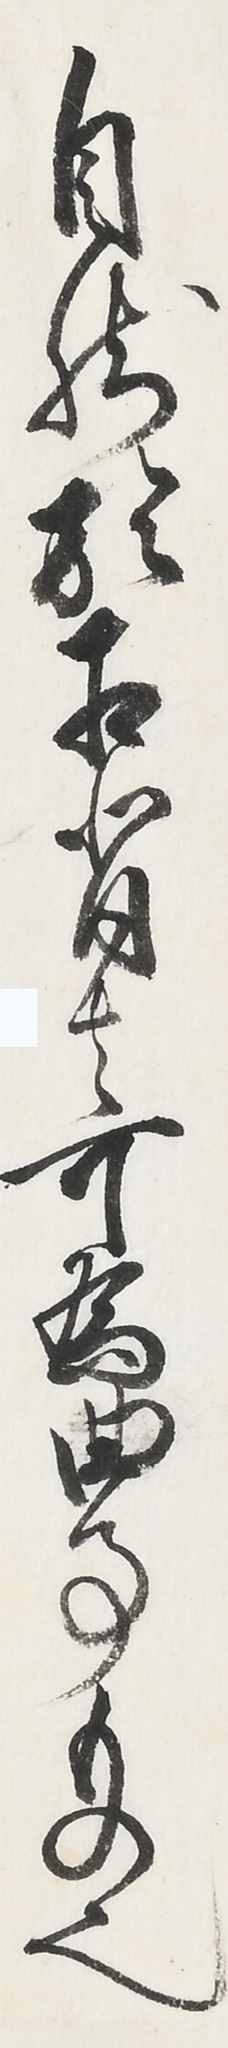自然於相背者可為曲事もの也
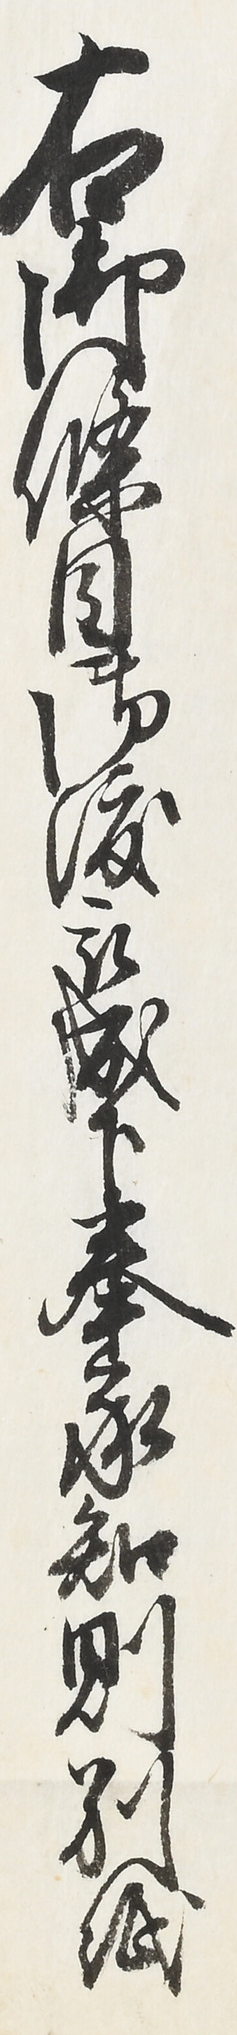右御條目御渡被成下奉承知則別紙
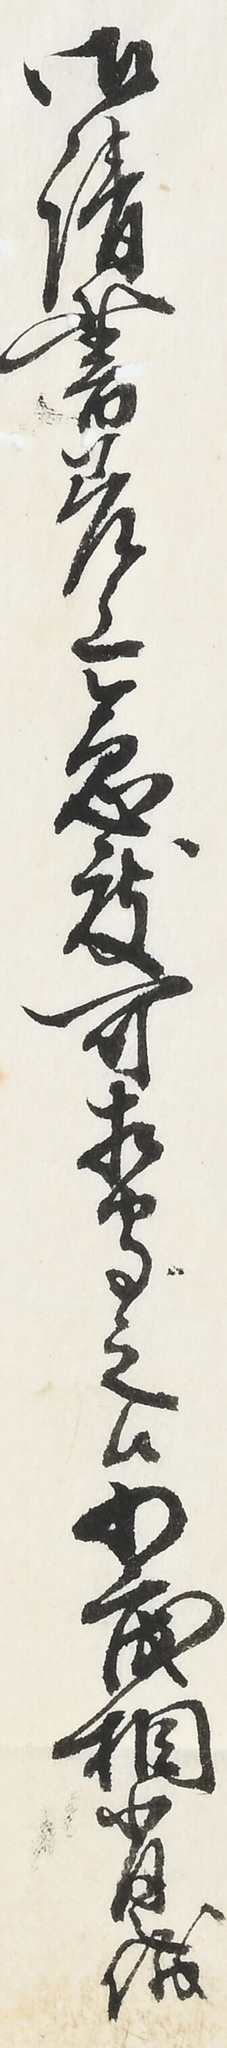請書差上急度可相守之候少茂相背儀

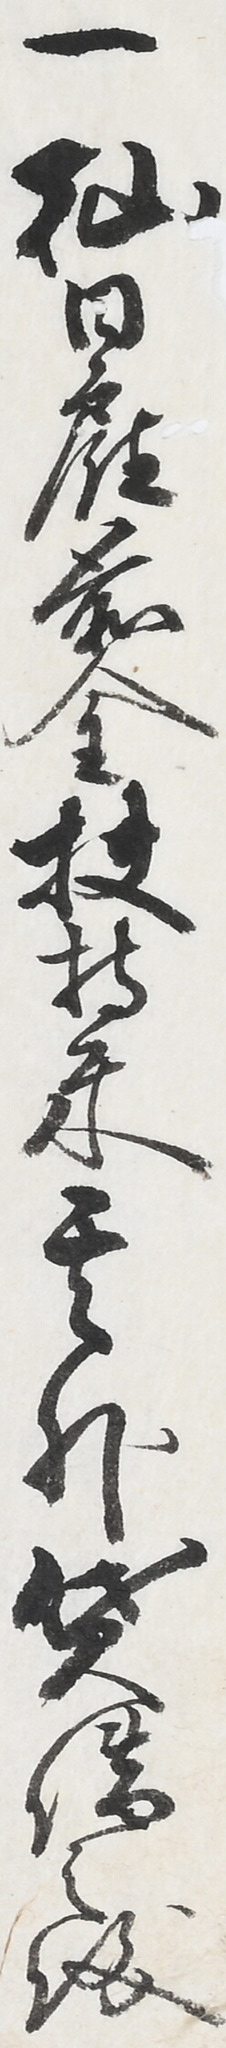一杣日雇前金扶持米其外貸借之儀
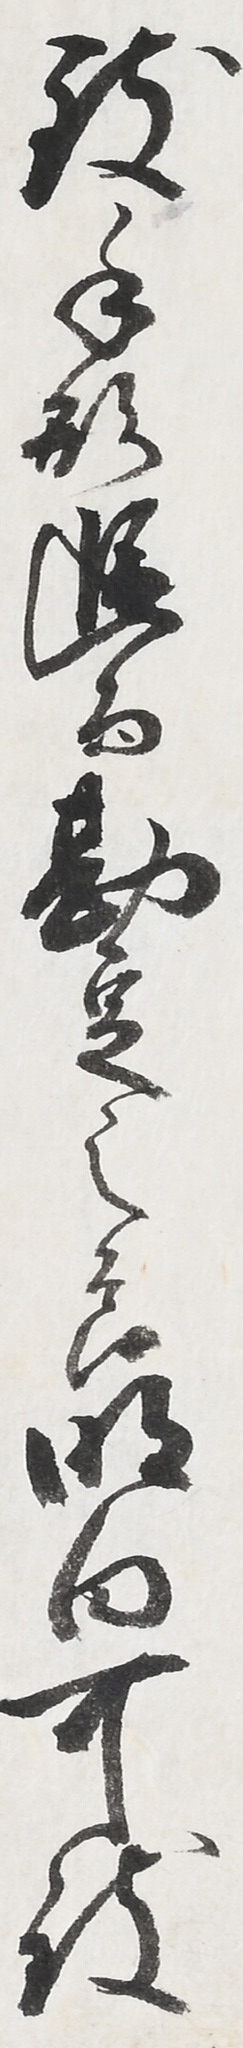致手形追而勘定之節明白可致
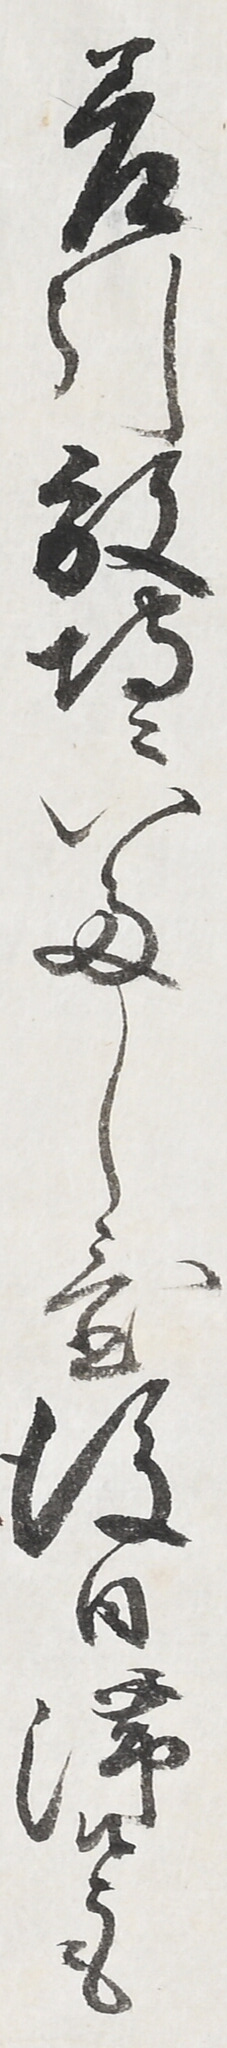差引放埒ニいたし置後日滞候とも
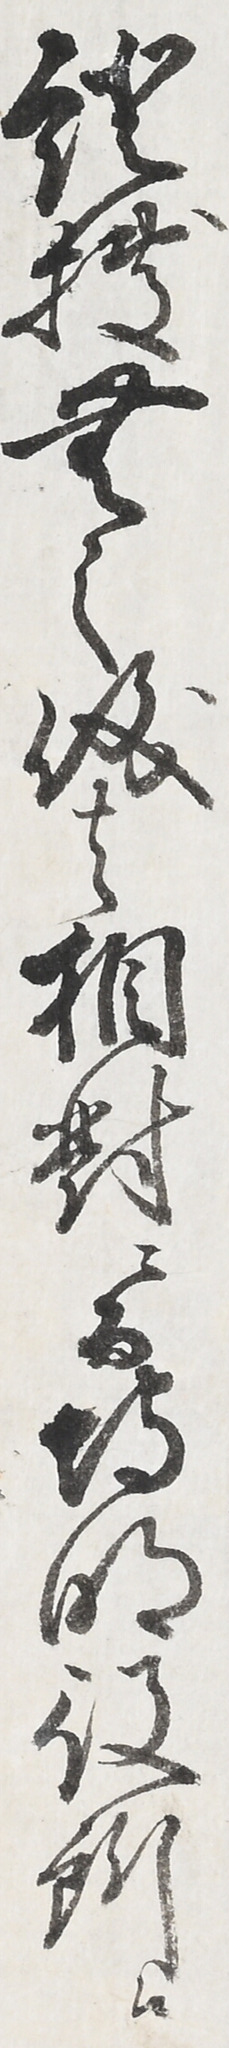証拠無之儀者相対ニ而埒明役所江
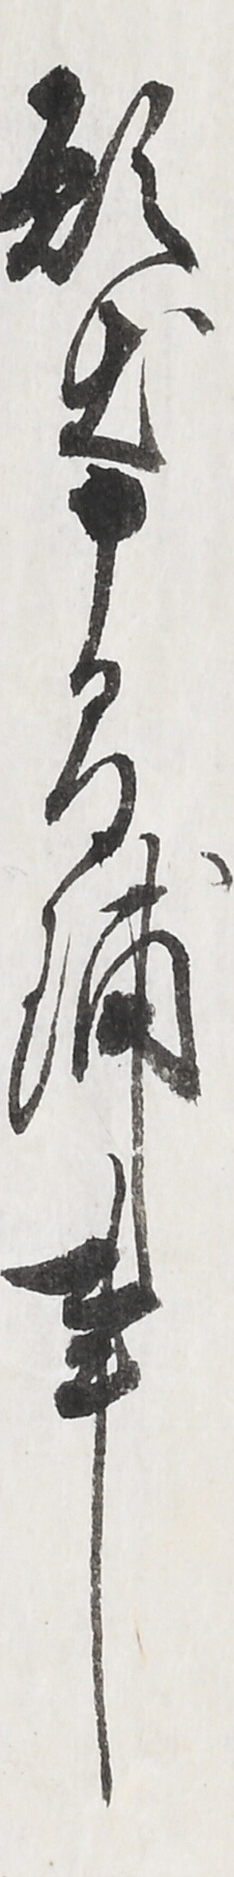願出申間敷事
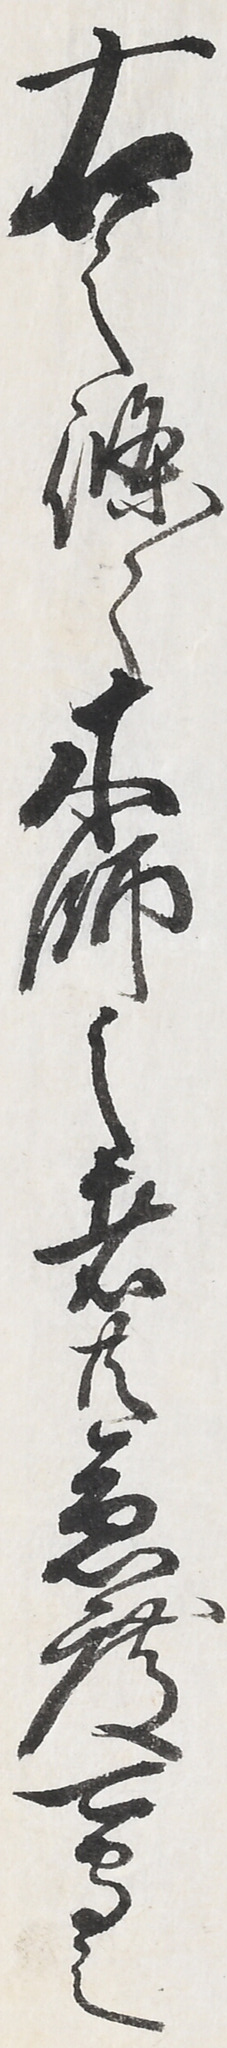右之條々木師之者共急度可守之
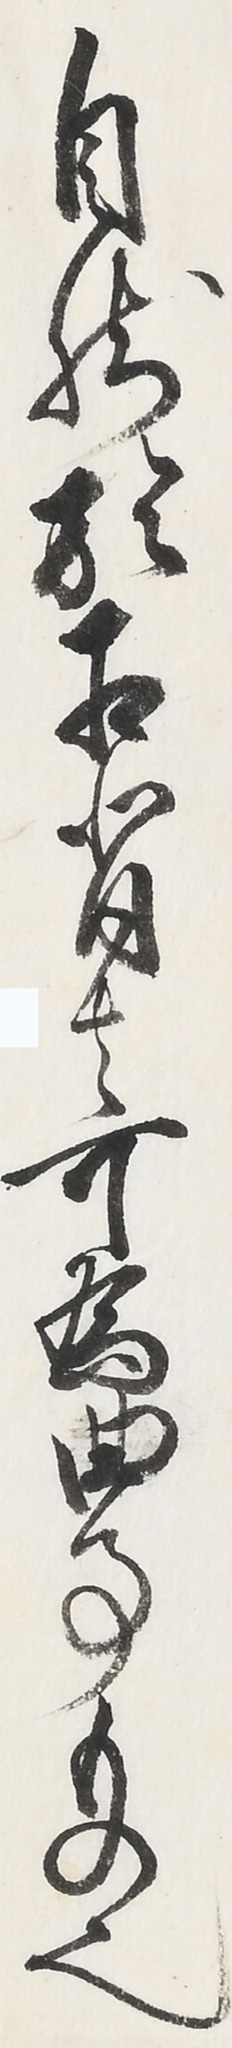自然於相背者可為曲事もの也
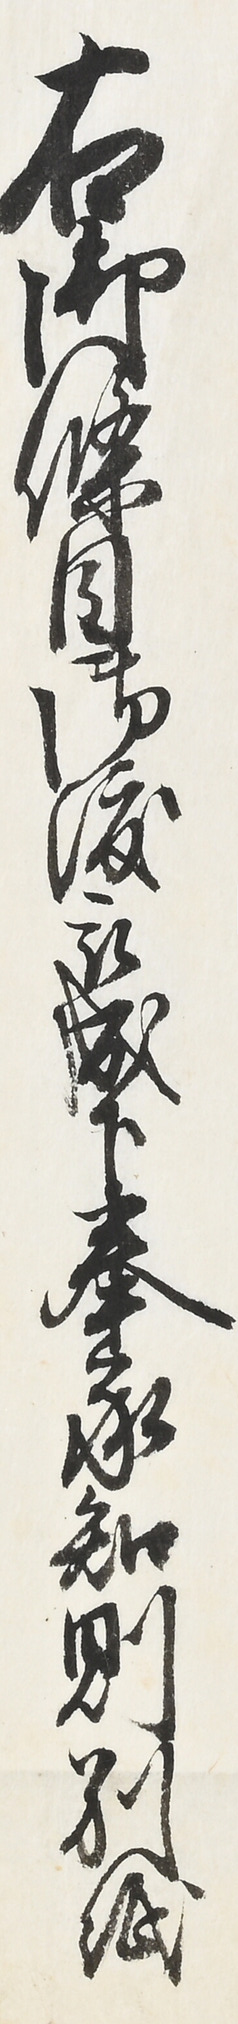右御條目御渡被成下奉承知則別紙
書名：小白木條目請書并判取帳
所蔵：伊那市立高遠町図書館・合同会社AMANE
